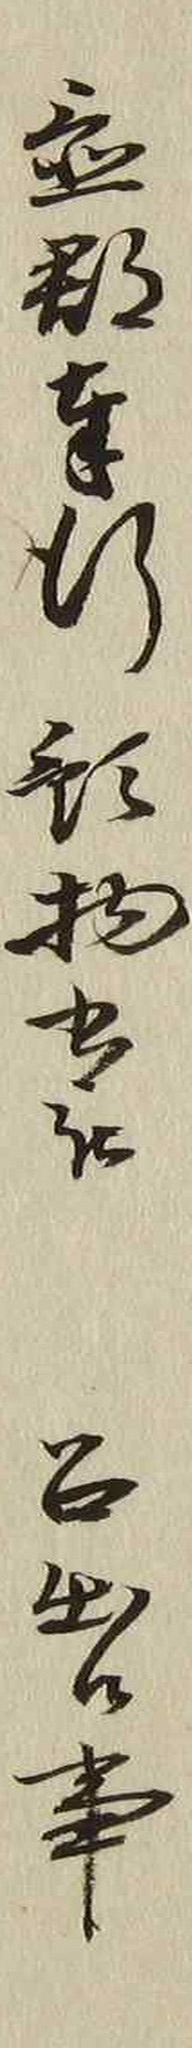置郡奉行預物書被召出候事
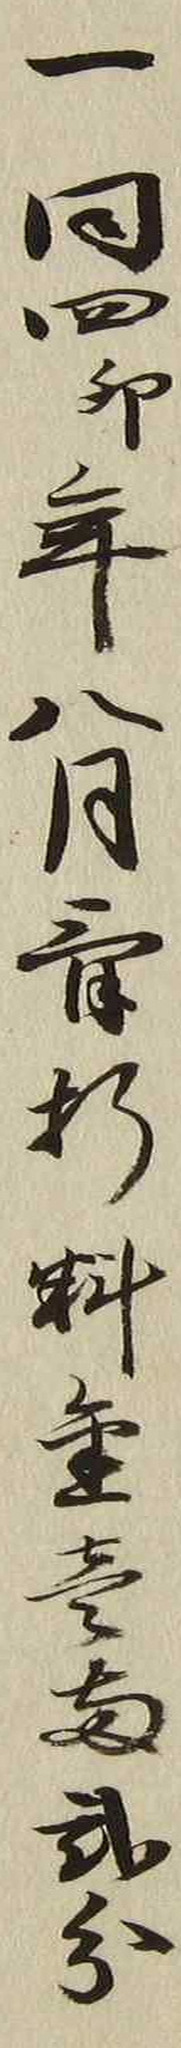一同四卯年八月骨折料金壱両弐分
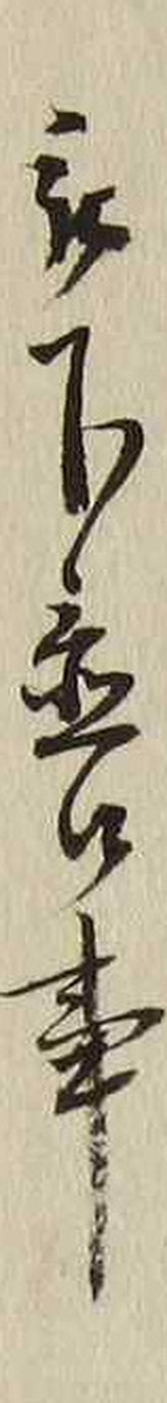被下置候事
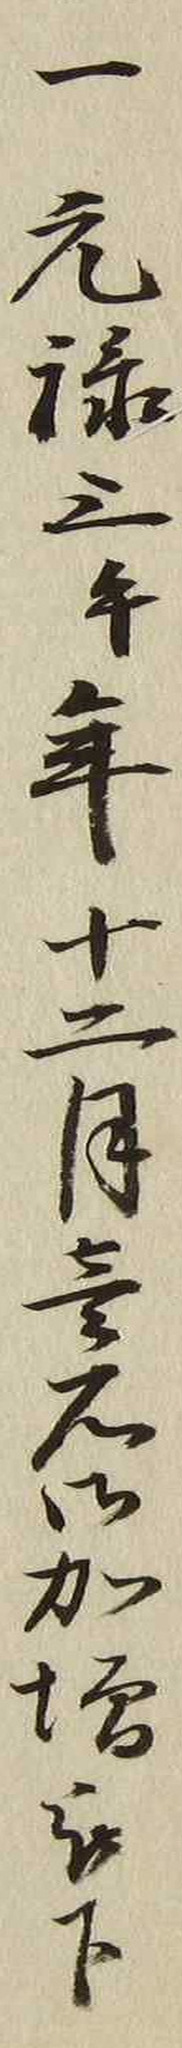一元禄三午年十二月壱石御加増被下
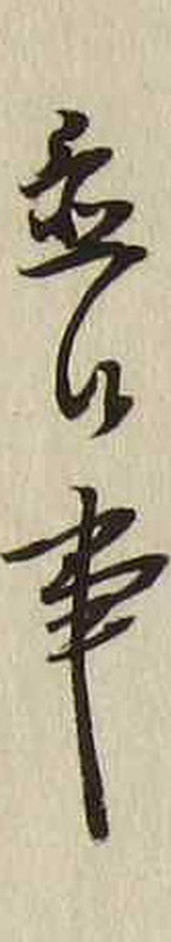置候事
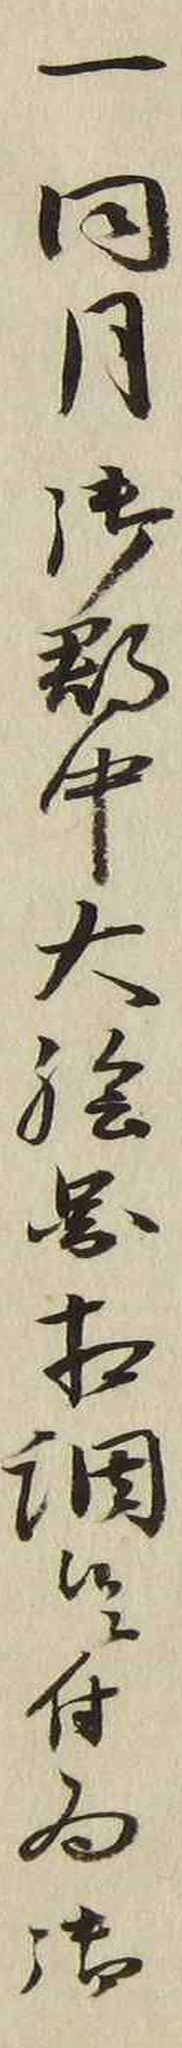一同月御郡中大絵図相調候ニ付為御
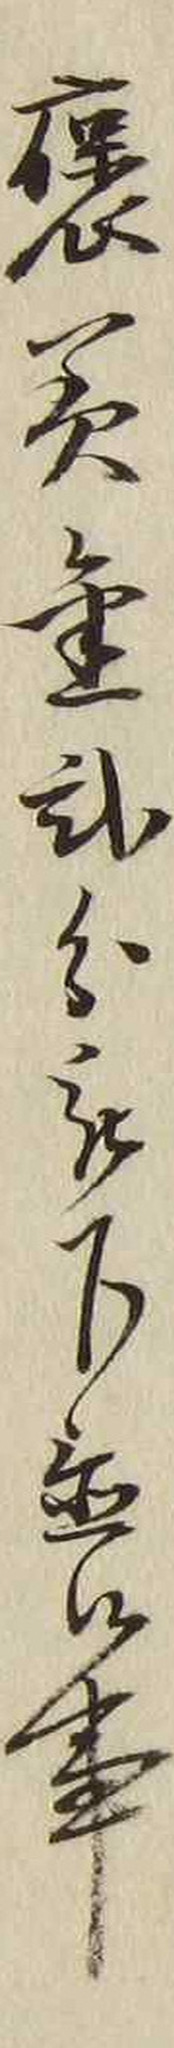褒美金弐分被下置候事

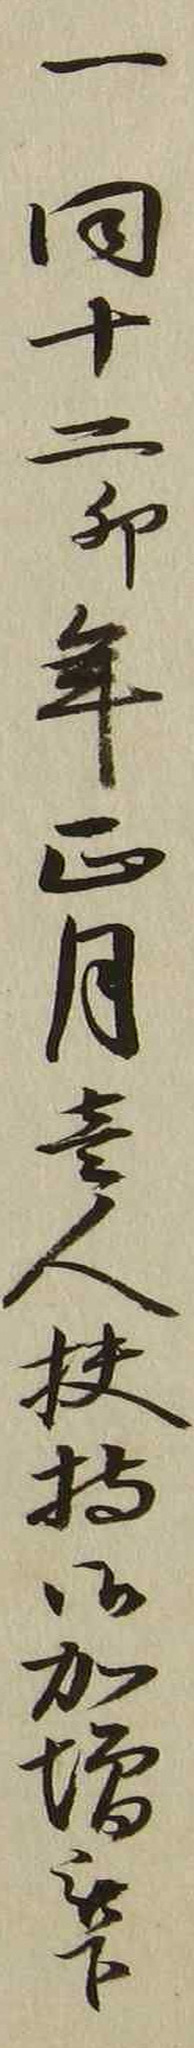一同十二卯年正月壱人扶持御加増被下
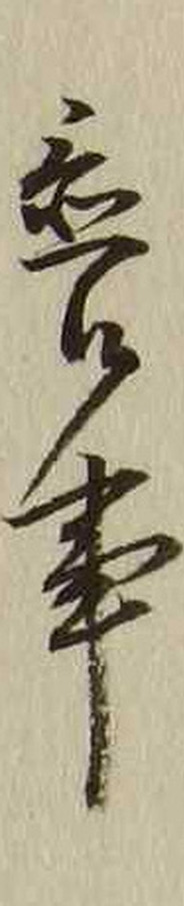置候事
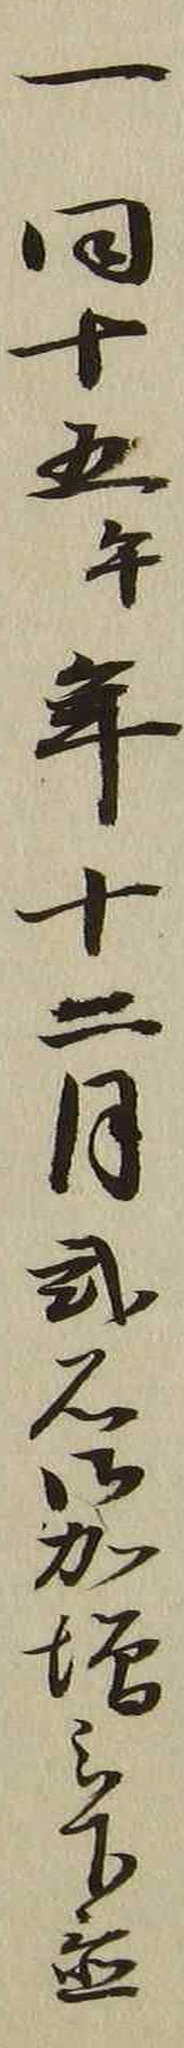一同十五午年十二月弐石御加増被下置
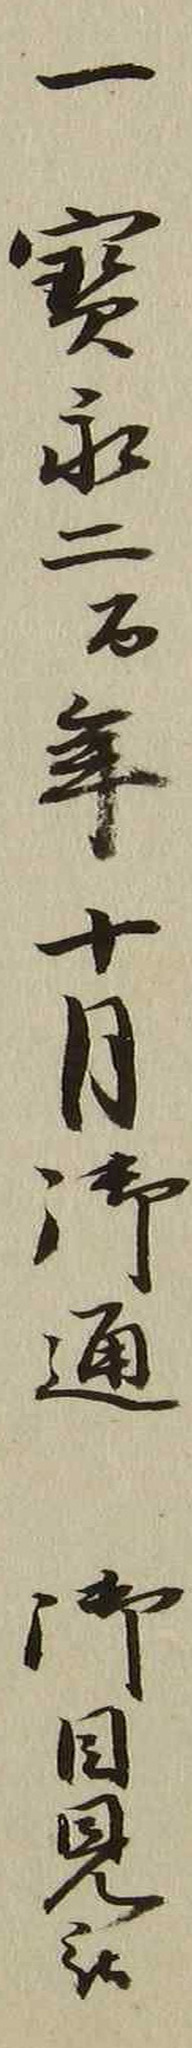一寛永二酉年十月御通御目見被
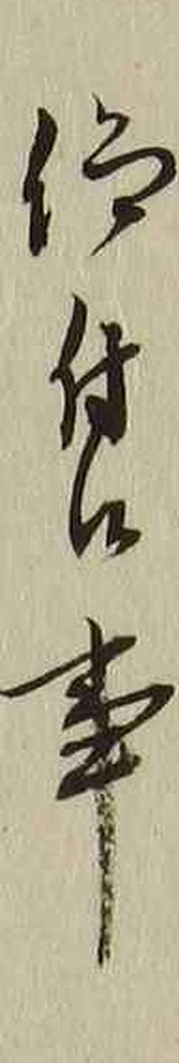仰付候事
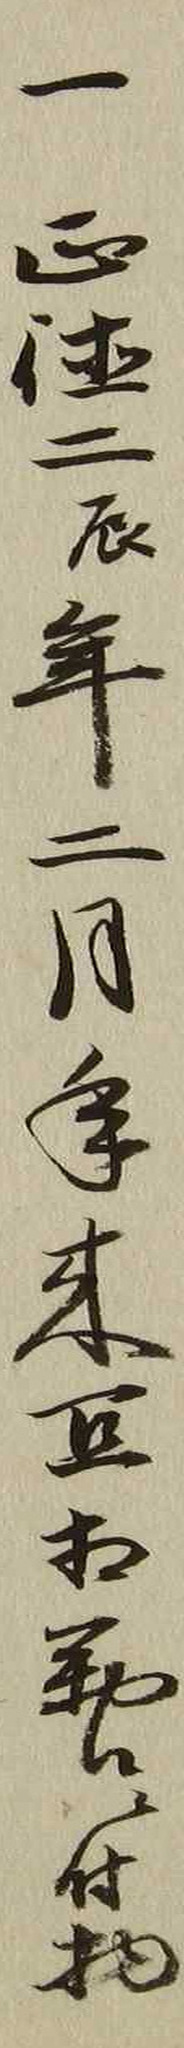一正徳二辰年二月年来宜相勤候ニ付物
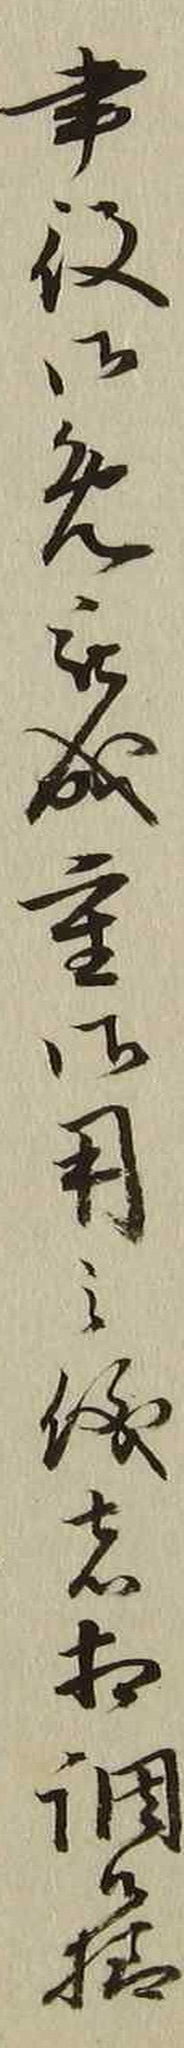書役御免被成重御用之儀者相調候様
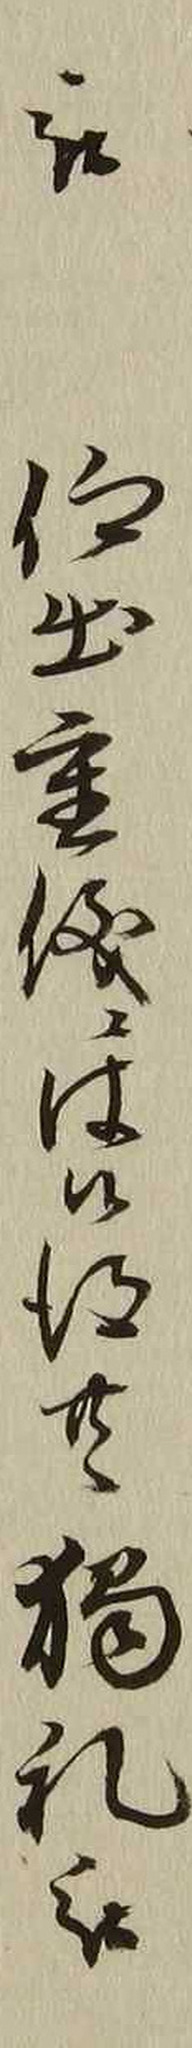被仰出重儀ニは候得共独礼被
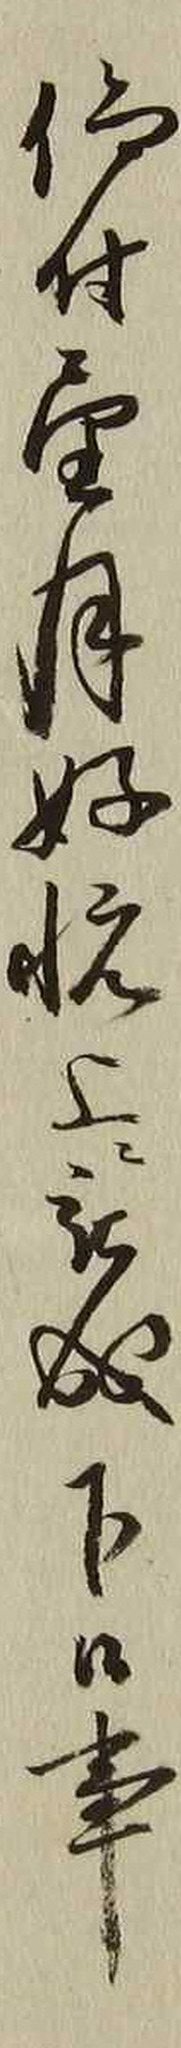仰付望月好悦上ニ被成下候事
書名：諸士系譜　巻之61　と之部4
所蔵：会津若松市立会津図書館
